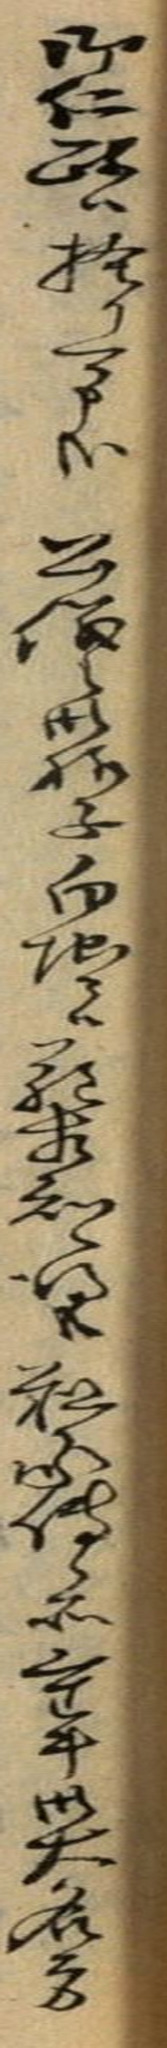御仁政ハ捨り可申哉公儀之御様子地ニハ難相知候得共粗承伝候所重年御大名方
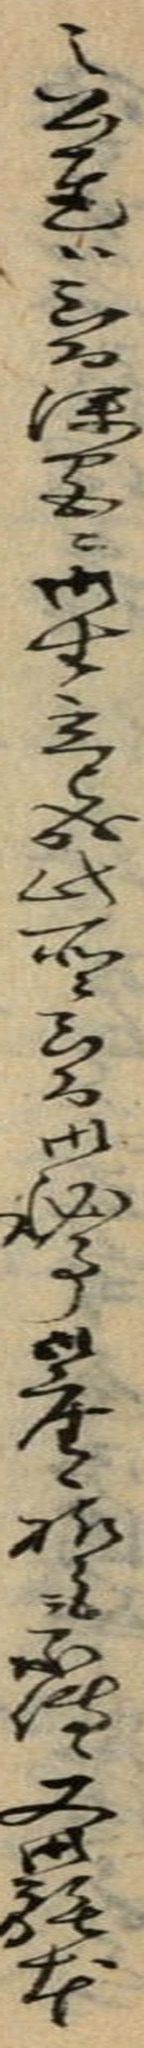之公達ハ至而深宮ニ御生立被成此所ニ至而御秘事御座候様ニも承伝候又御旗本
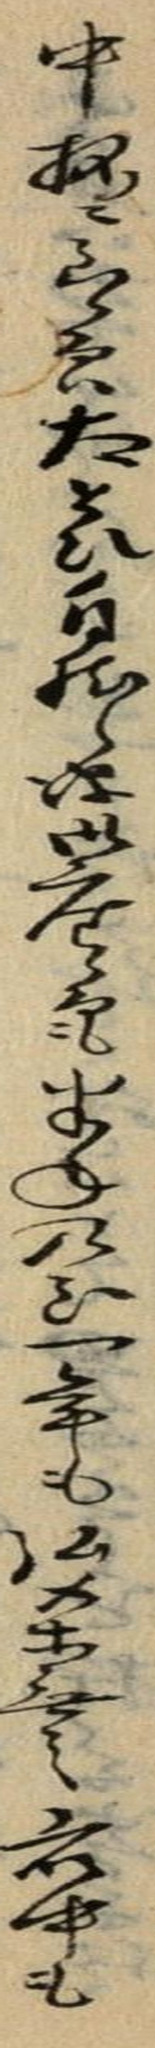中抔ニ至候而ハたとひ自然之儀御座候而も半年乃至一年も弘メ等無之衆中も
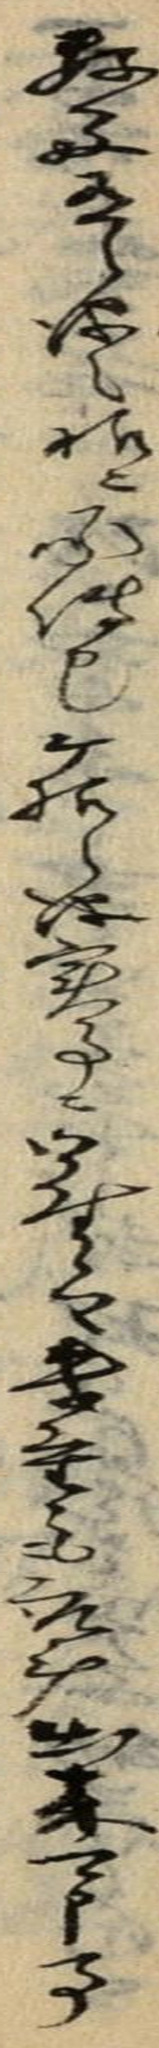数多有之儀之様ニ承伝申候ケ様之儀実事ニ御座候ハヽ幾重ニも取計出来可申事
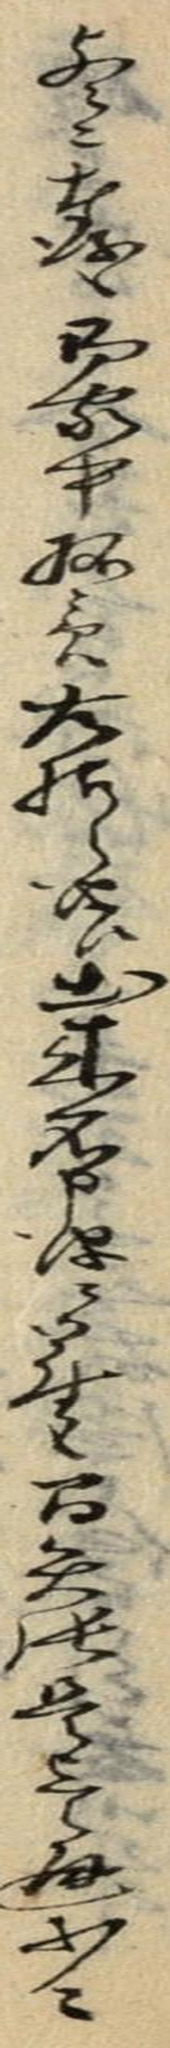歟ニ奉存候御家中抔ニ而ハ左様之儀ハ出来不申儀ニ御座候間矢張是迄之通少々
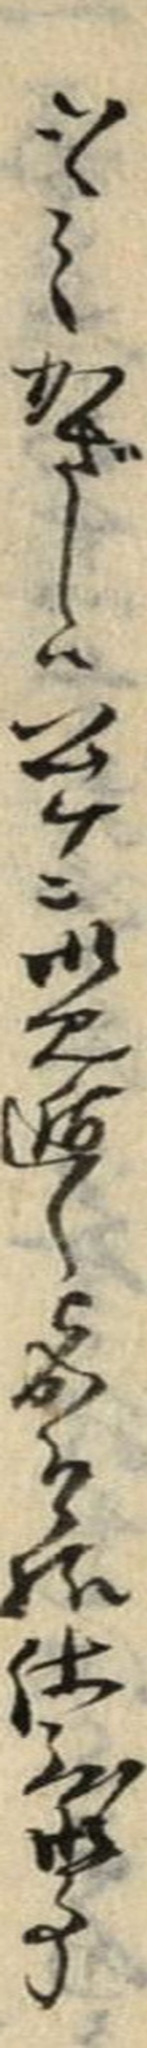ツヽ之かざし候公ケニ御見遁し被成下候様仕度御事
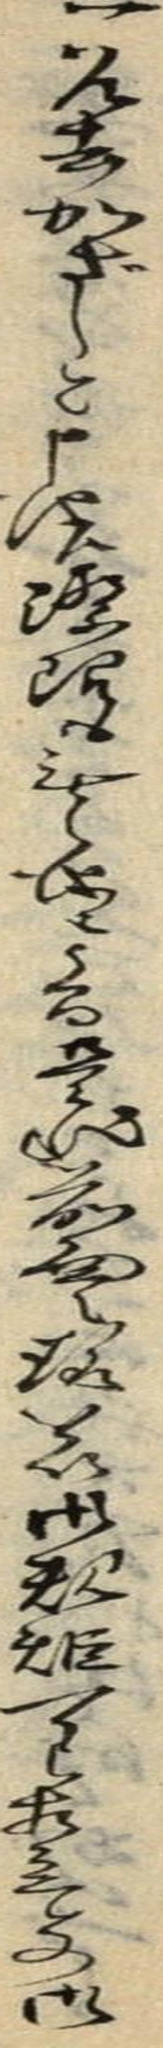一乍去かざしと申儀ハ際限も無之儀も候間是非前回之趣を以御規矩可被相立との御
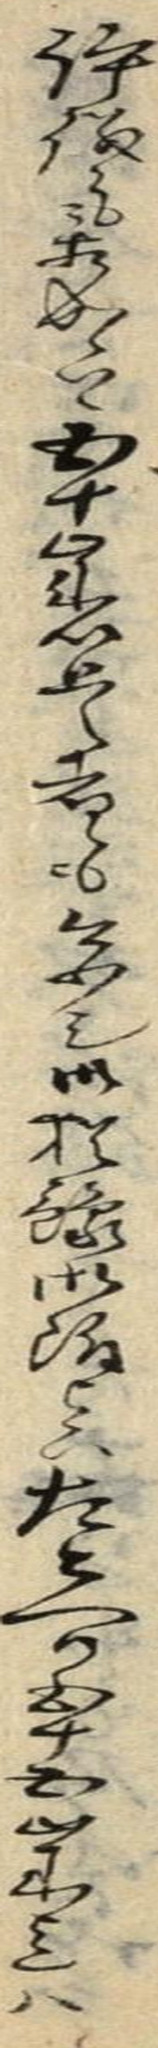評儀ニも相成候ハヽ五十歳以上之者も今少シ御猶予御附候ハヽたとへハ五十五歳以上迄ハ
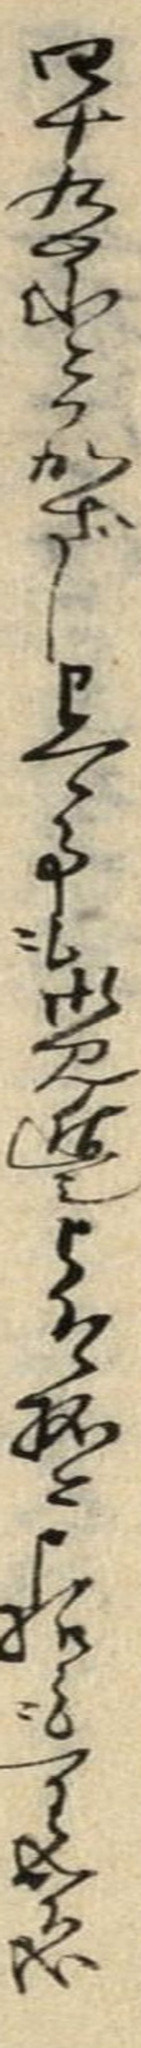四十九歳とかかざし申上候事も御見遁し被下候抔と申様ニも可被成下哉
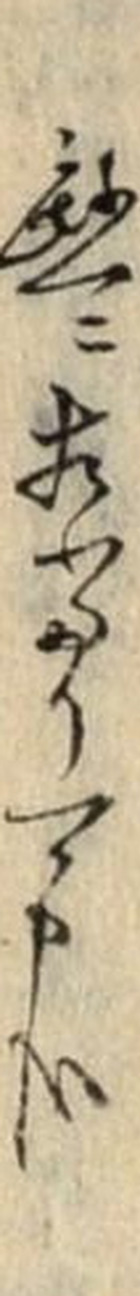愍ニ相当り可申哉
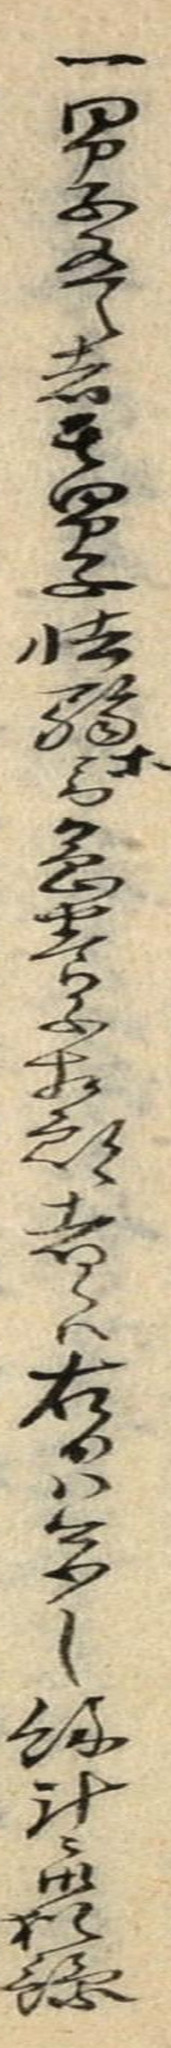一男子有之者其男子怯弱等ニ而急養子相願候者候ハ右ゟハ今少し余計ニ御猶予
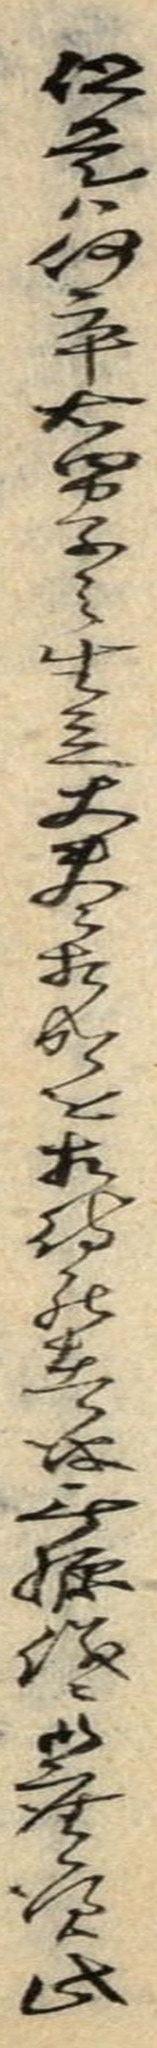但是ハ何卒右男子之生立丈夫ニ相成候を相待罷在候儀無拠儀ニ御座候得ハ此
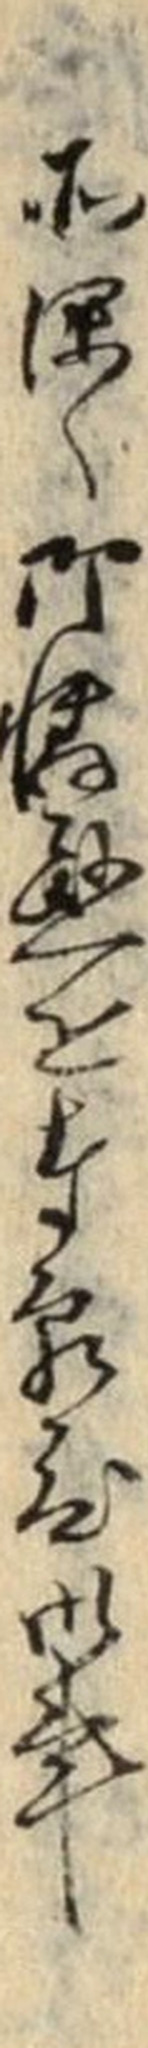所深く御憐憫を奉願度御事
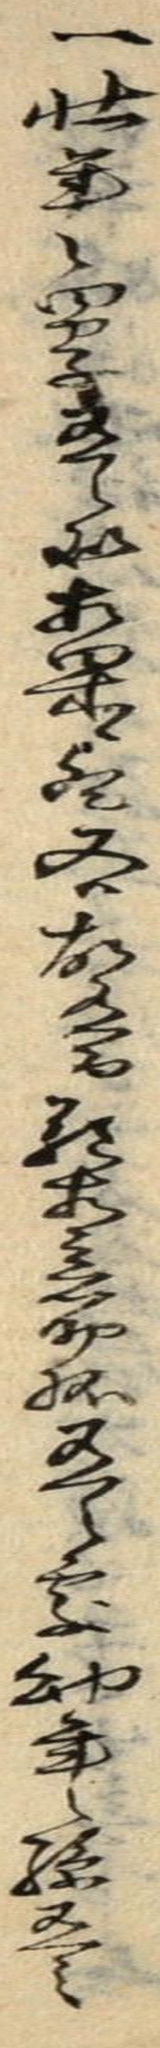一壮年之男子有之処相果候歟又ハ故有而難相立筋抔有之処幼年之孫有之

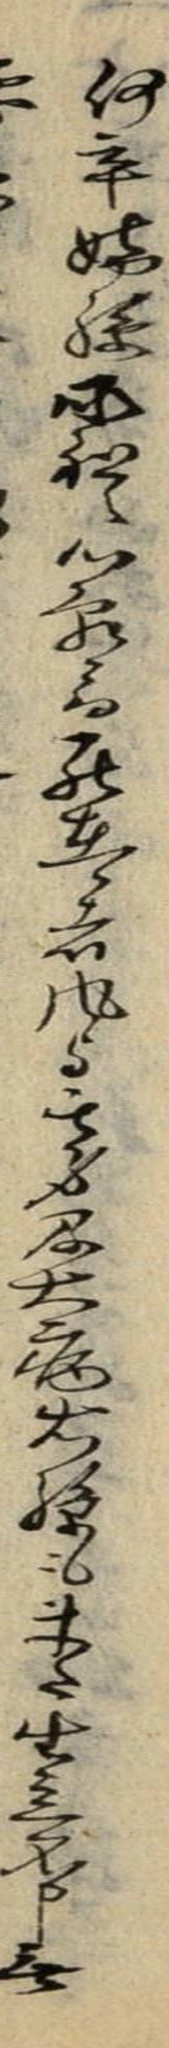何卒嫡孫承祖之心願ニ而罷在候者風与其身及大病右孫も未た生立不申無
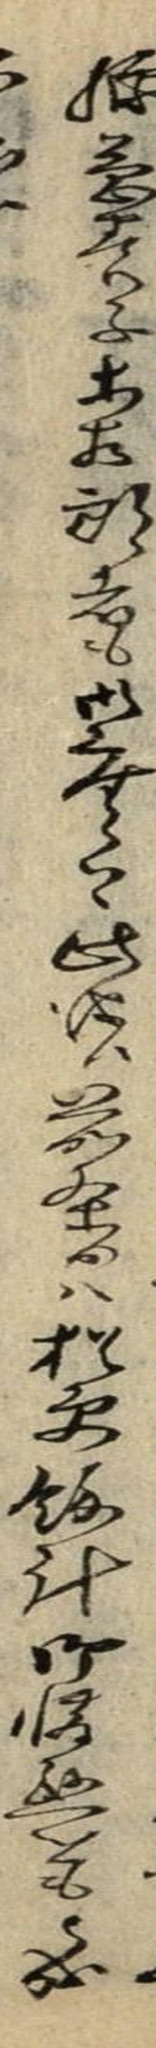拠急養子等相願候者も御座候ハヽ此儀ハ前条ゟハ猶更余計御憐憫をも被成
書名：養子縁組之部
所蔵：福井県文書館 Fukui Prefectural Archives
